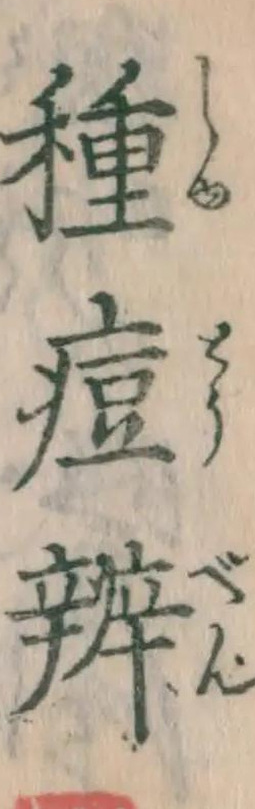種痘弁
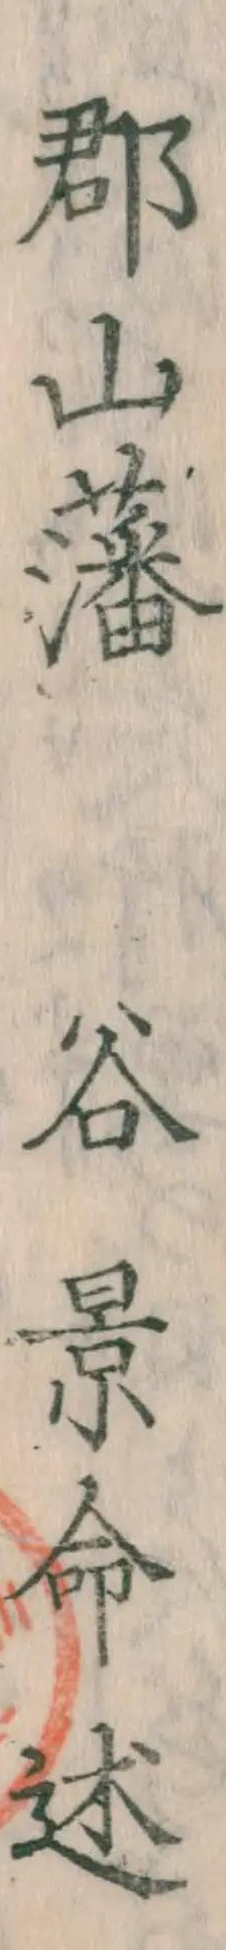郡山藩谷景命述
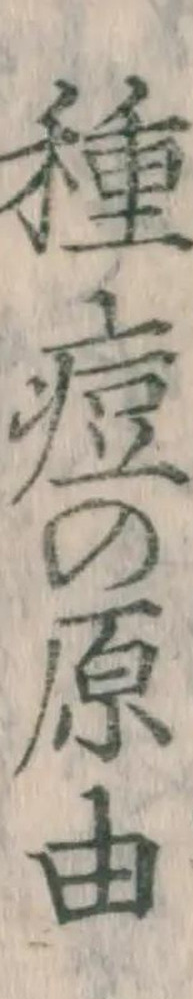種痘の原由
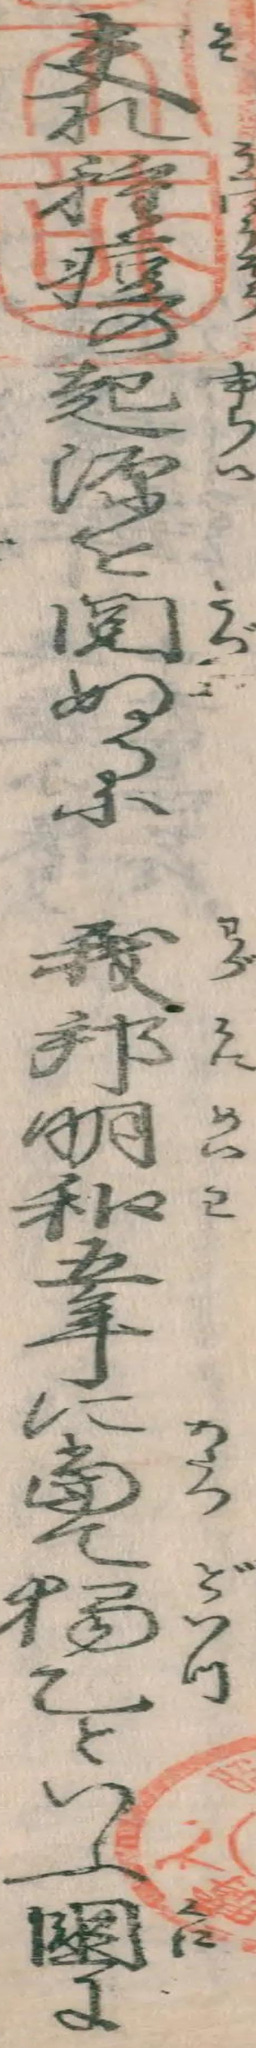夫れ種痘の起源を閲ぬるに我邦明和五年に当て獨乙といふ国に
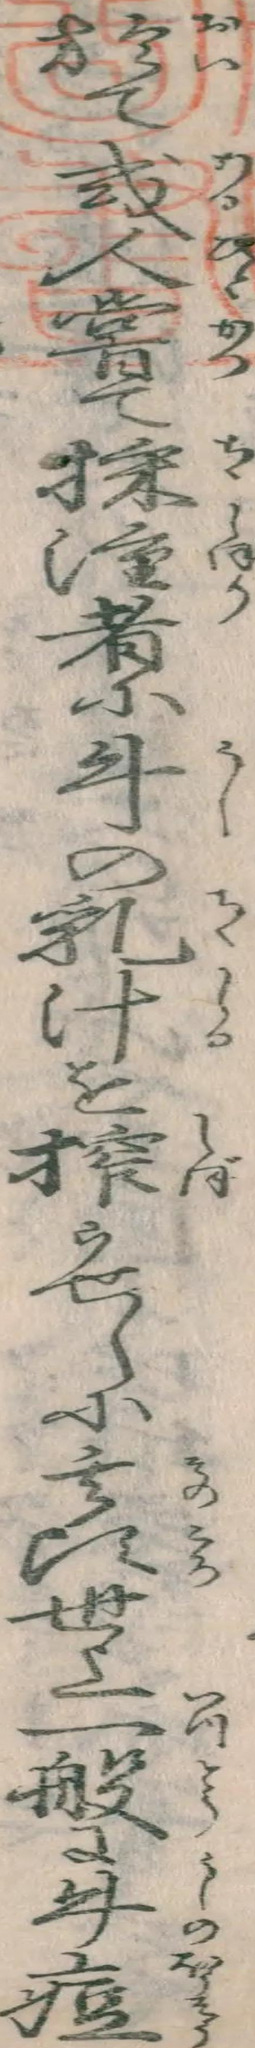於て或人嘗て採種者者に牛の乳汁を搾りせしに其頃世上一般に牛痘
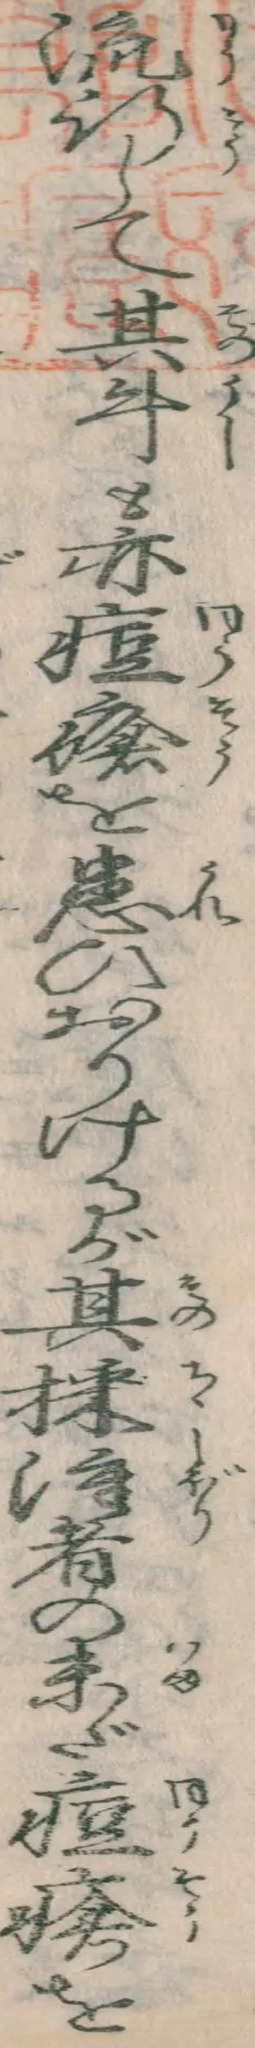流行して其牛も亦痘瘡を患ひおりけるが其採搾者の未だ痘瘡を
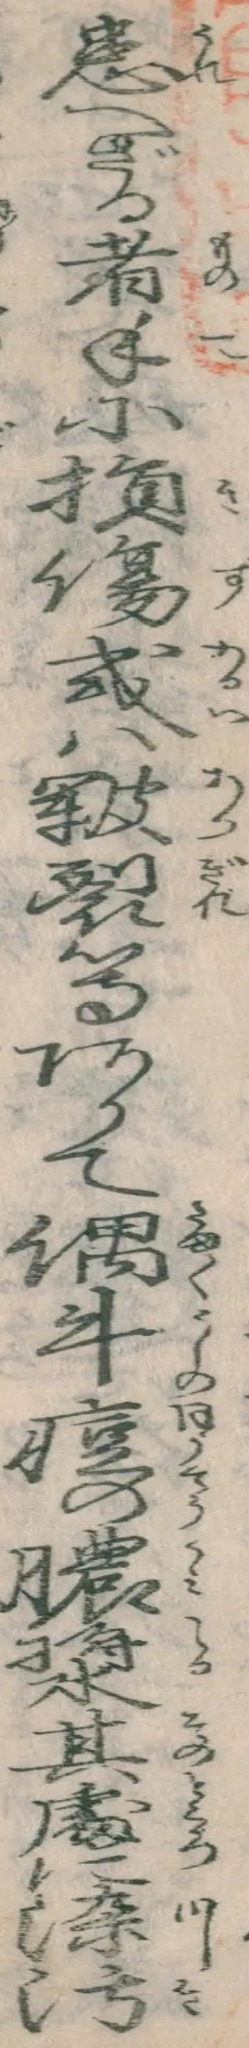患へざる者手に損傷或は跛烈等ありて偶牛痘の膿漿其処に染汚
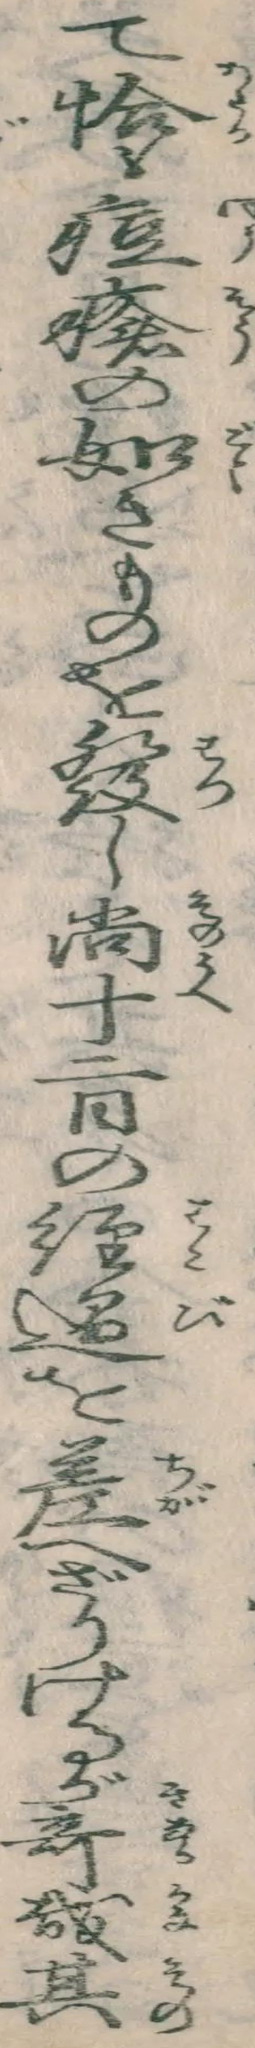て恰も痘瘡の如きものを発し尚十二日の経過を差へざりけるが奇哉其
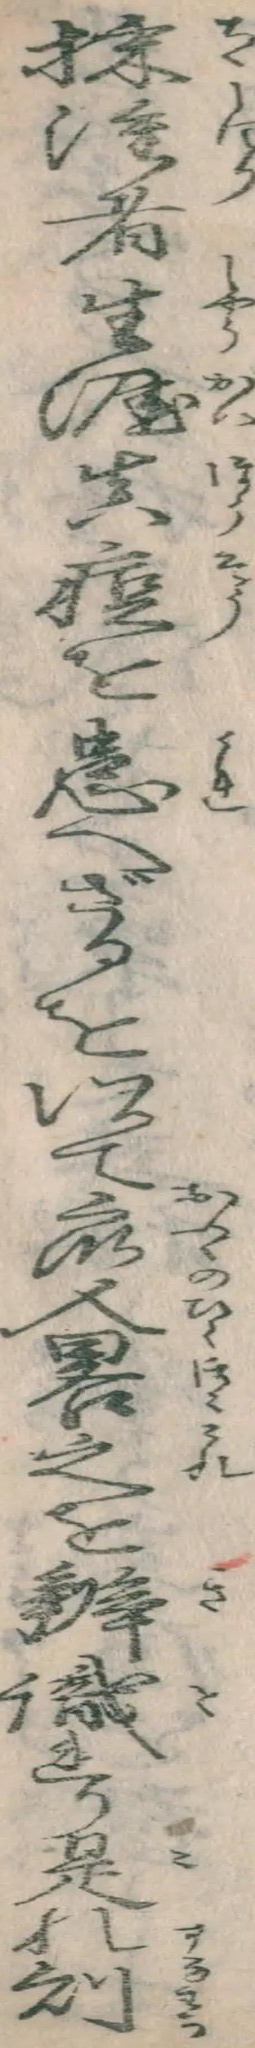採搾者生涯真痘を患へざるを以て衆人略之を弁識れり是れ則
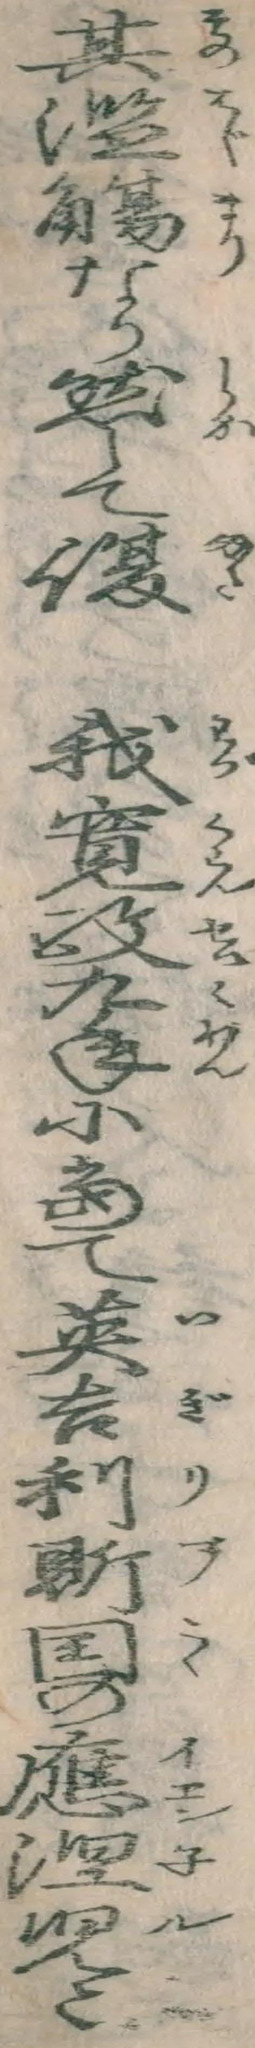其濫觴なり然して復我寛政九年に当て英吉利斯国の応涅児と

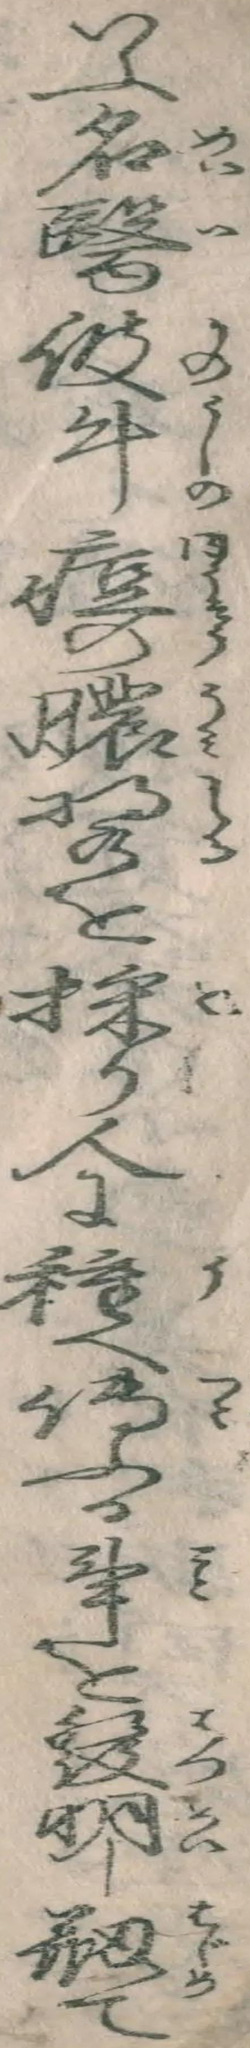いふ名医彼牛痘の膿漿を採り人に種へ伝ふる事を発明し初て
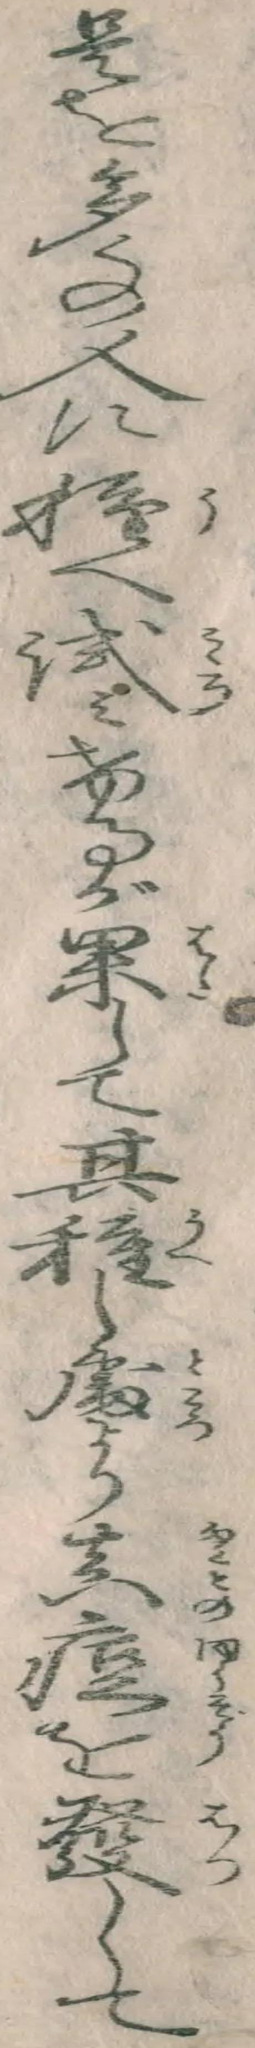是を多くの人に種へ試みけるが果して其種し処より真痘を発して
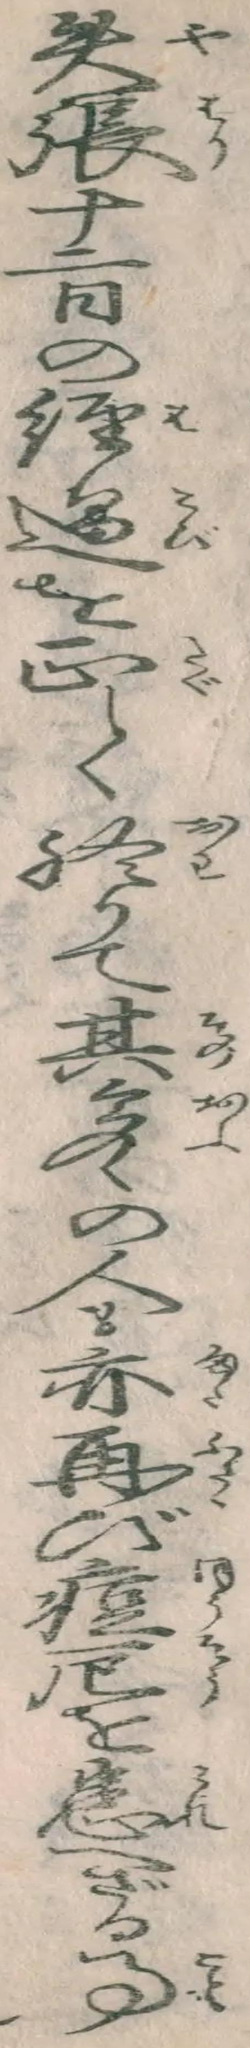矢張十二日の経過を正しく終りて其多くの人も亦再び痘厄を患へざる事
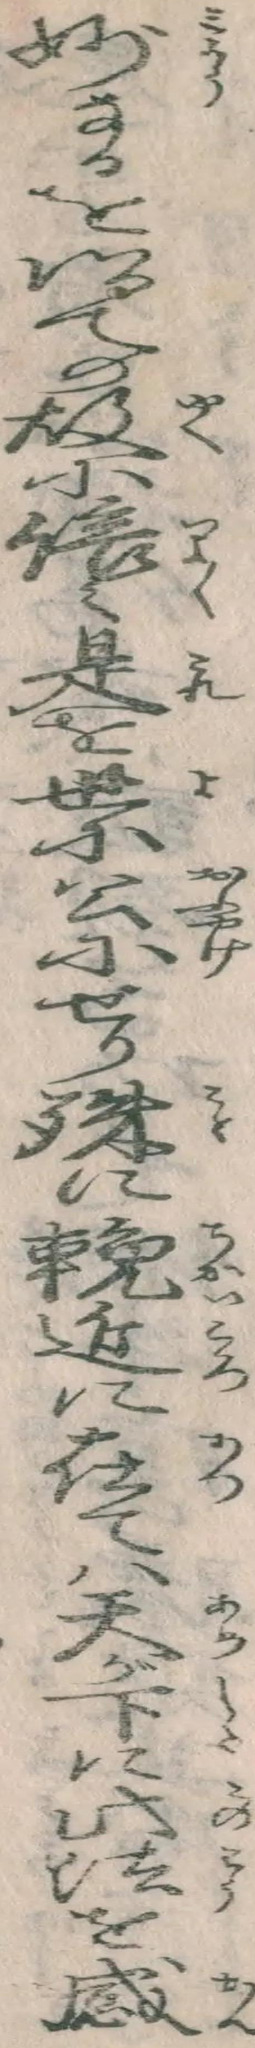妙なるを以ての故に倍々是を世に公にせり殊に輓近に在ては天が下に此法を感
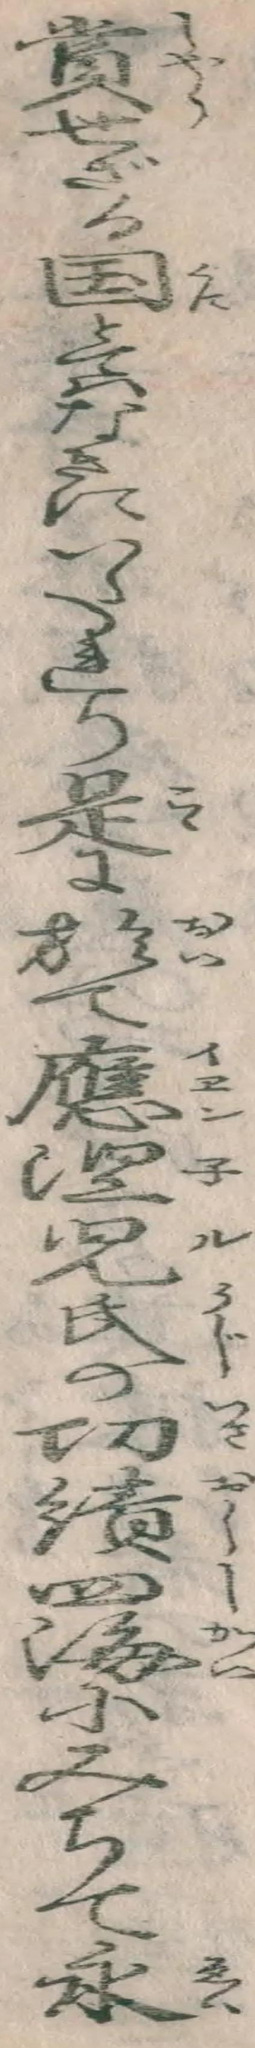賞せざる国とてはなきにいたれり是に於て応涅児氏の功績四海にみちて永
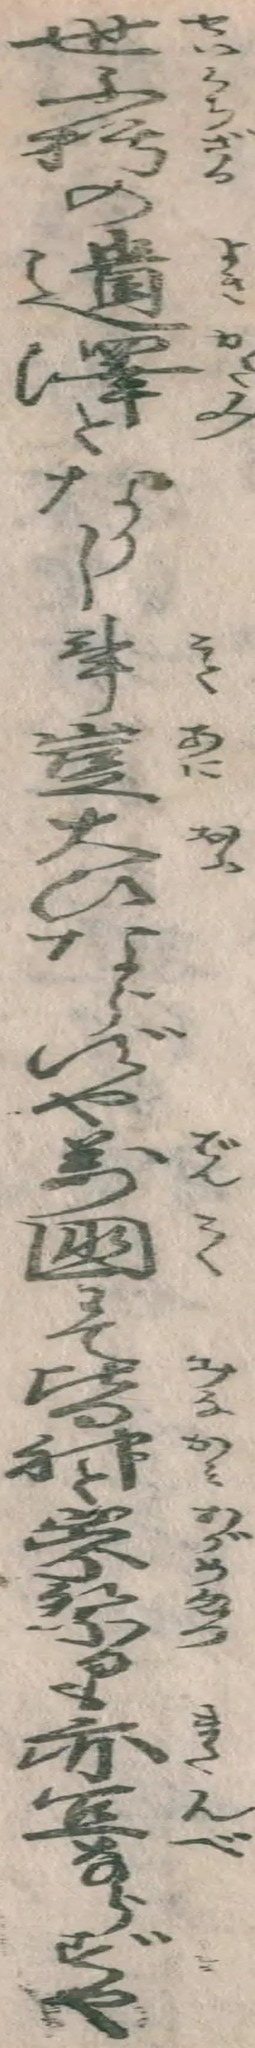世不朽の遺沢となりし事豈大ひならずや万国にて皆神と崇祭るも亦宜ならずや
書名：種痘辨
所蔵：国立国会図書館 National Diet Library, JAPAN
